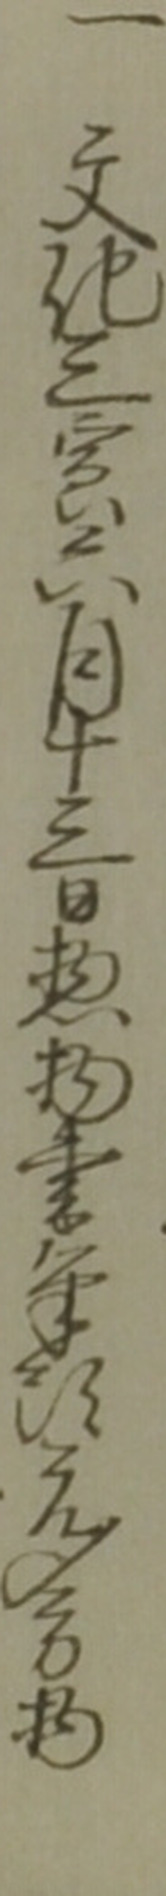一文化三寅六月十三日惣物書筆頭元〆方物
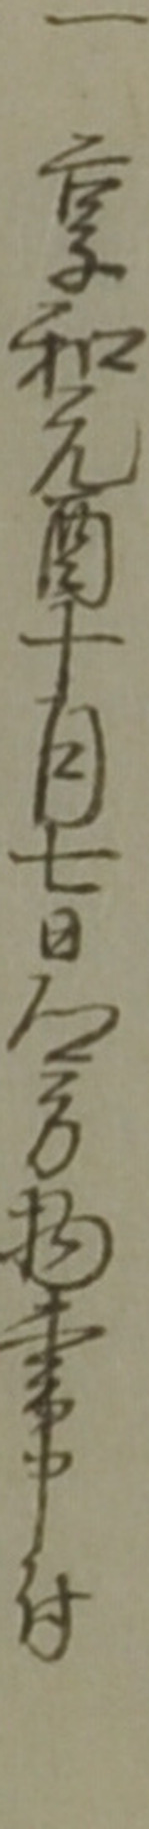一享和元酉十月七日郷組方物書申付
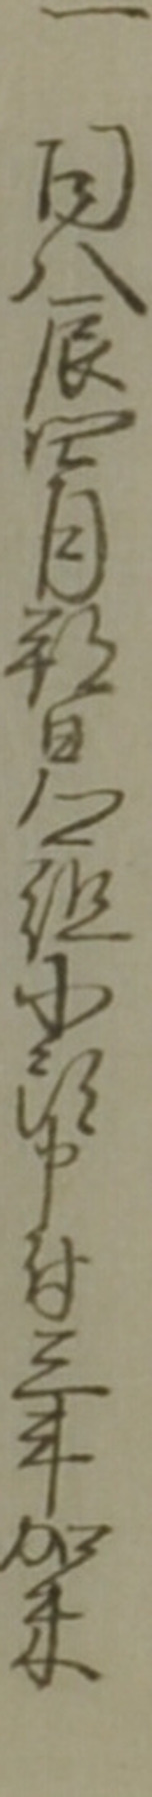一同八辰士四月朔日郷組小頭申付三斗加米
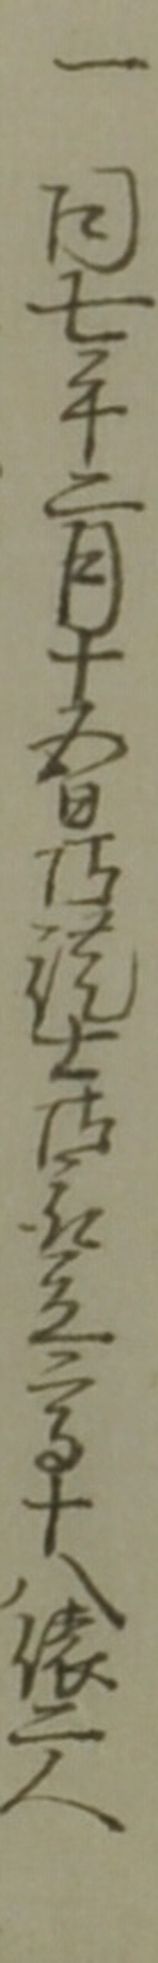一同七午二月十五日御徒士御取立高十八俵二人
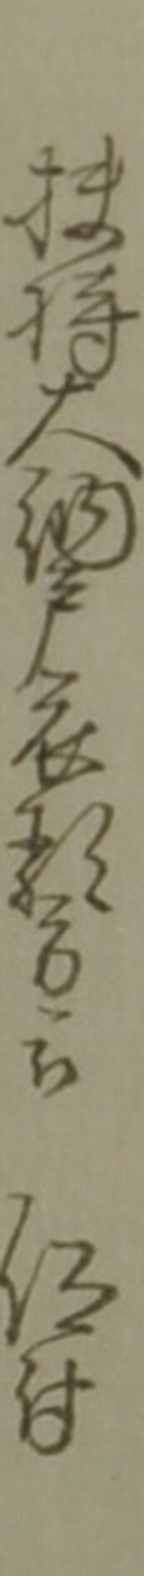扶持大納戸衣類方被仰付
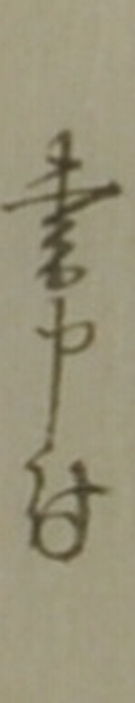書申付
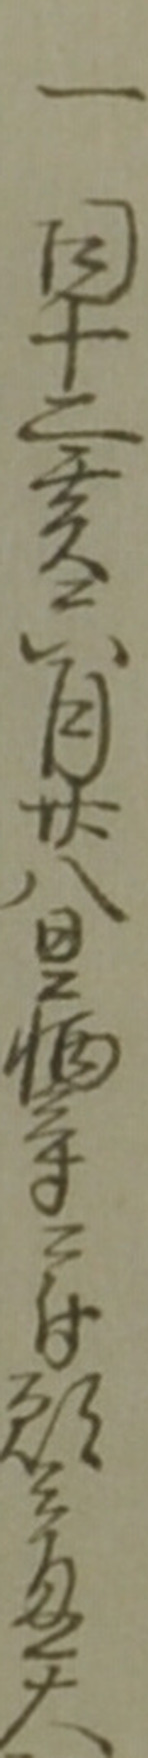一同十二亥六月廿八日病気ニ付願之通大納戸
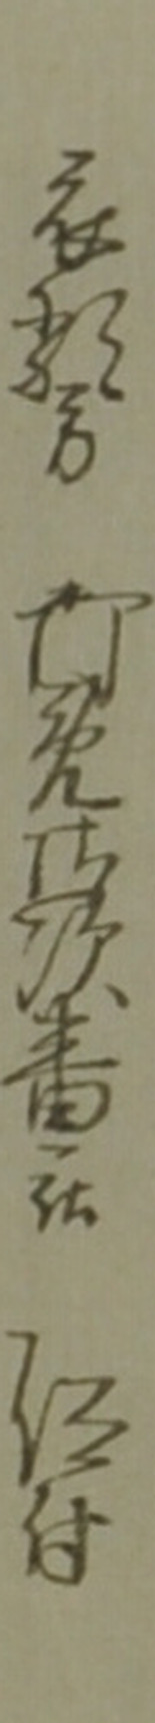衣類方御免御次番被仰付
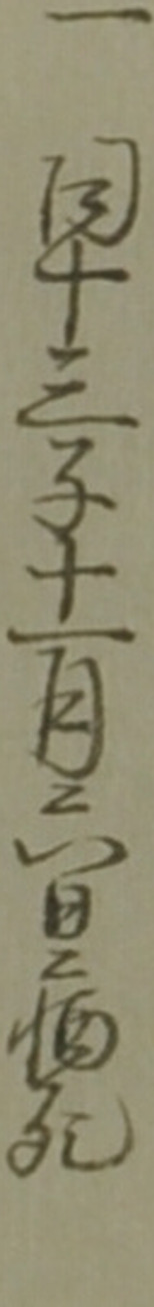一同十三子十一月六日病死
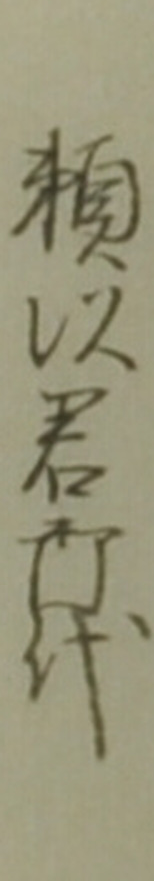頼以君御代
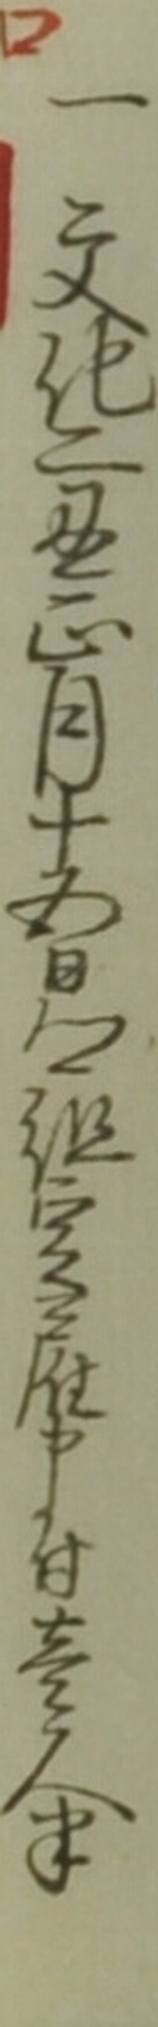一文化二丑正月十五日郷組定雇申付壱人半

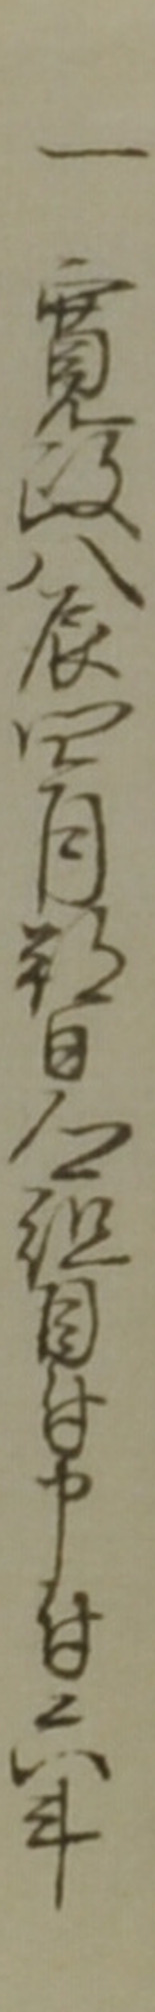一寛政八辰四月朔日郷組目付申付六斗
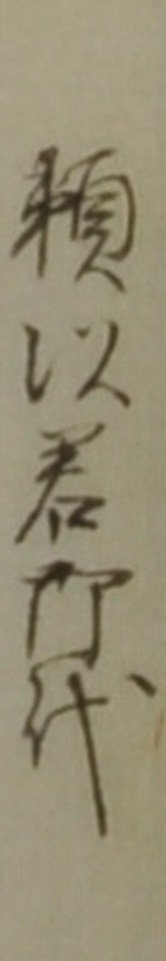頼以君御代
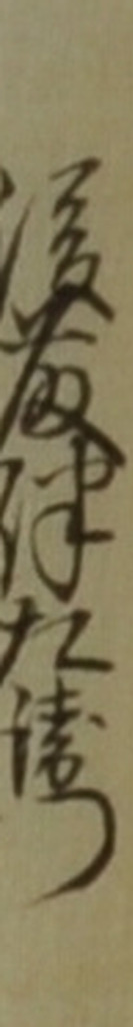後藤伴左衛門
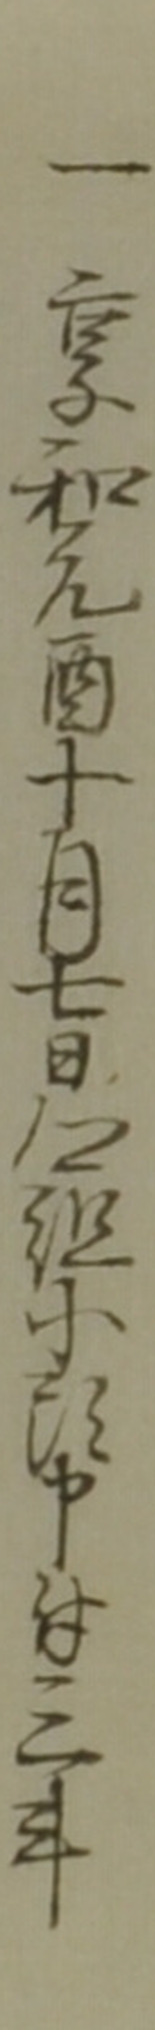一享和元酉十月七日郷組小頭申付三斗
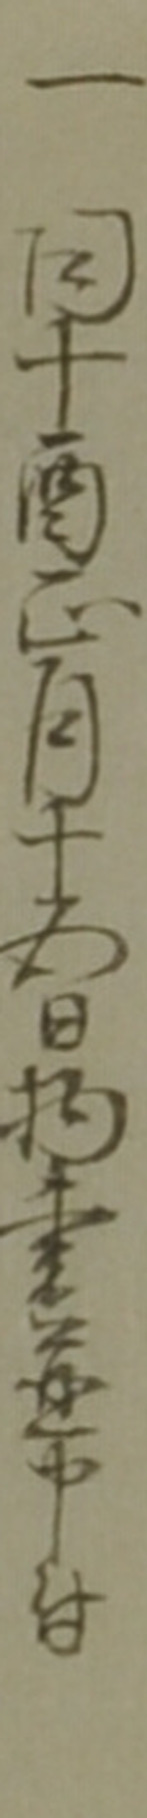一同十酉正月十五日物書並申付
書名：無足諸士勤仕録（六）
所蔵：伊那市立高遠町図書館・合同会社AMANE
